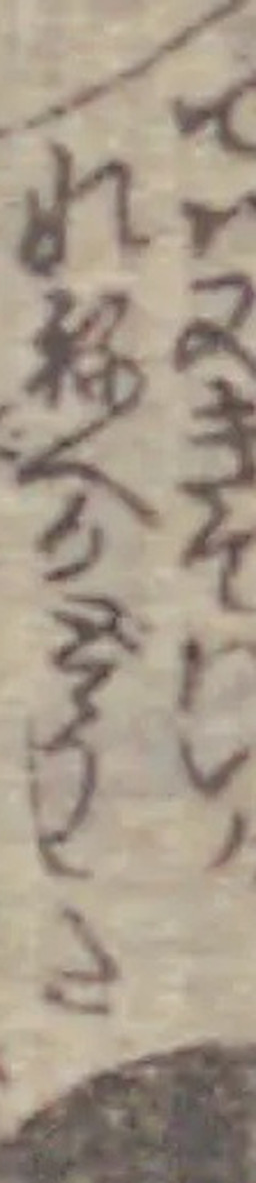れねへかどうした
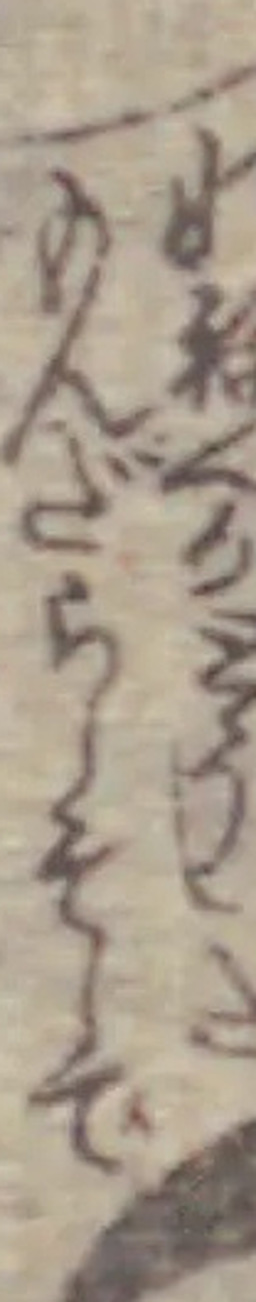もんだらうそして
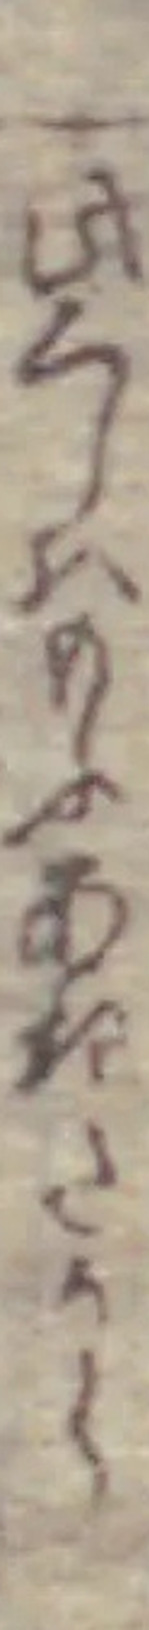此くしはもふあきたから
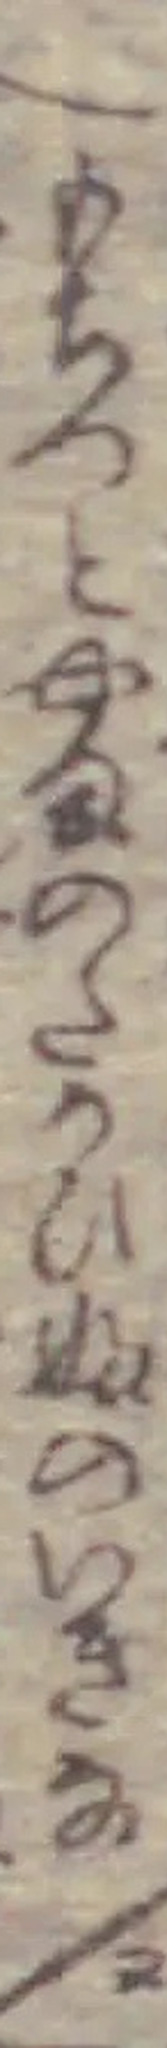もちつとやまのたかひ奴のいきな
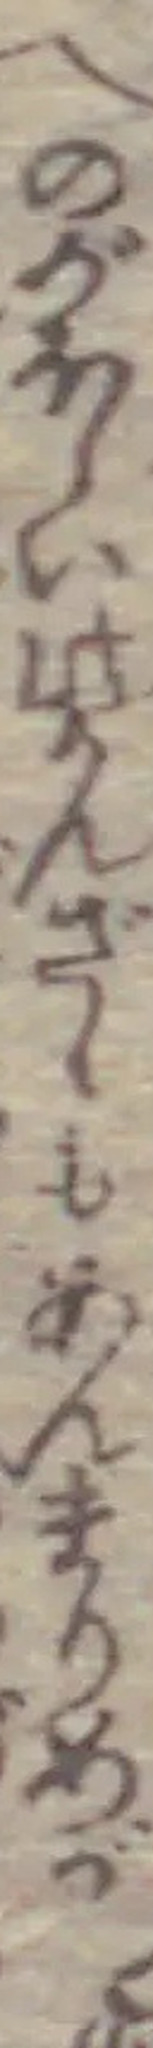のがほしい此かんざしもあんまりめが
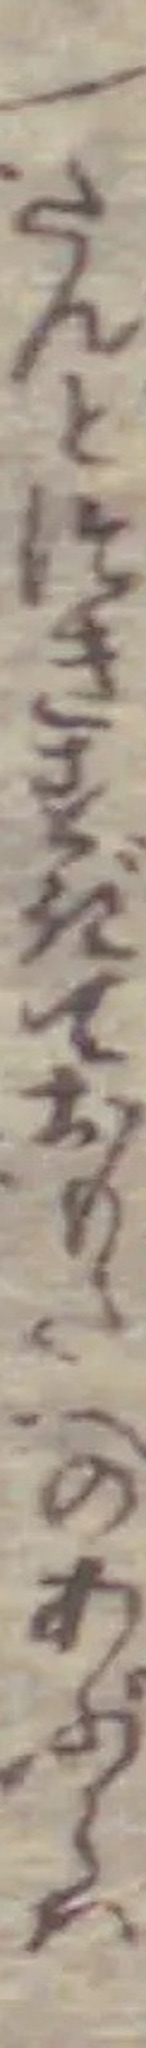たんとつきすぎておもたへのあぶらは
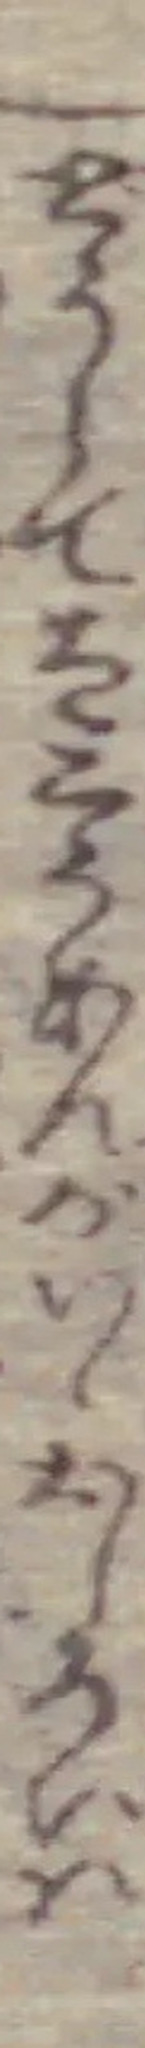どうして大三ろあんがいゝおしろいは
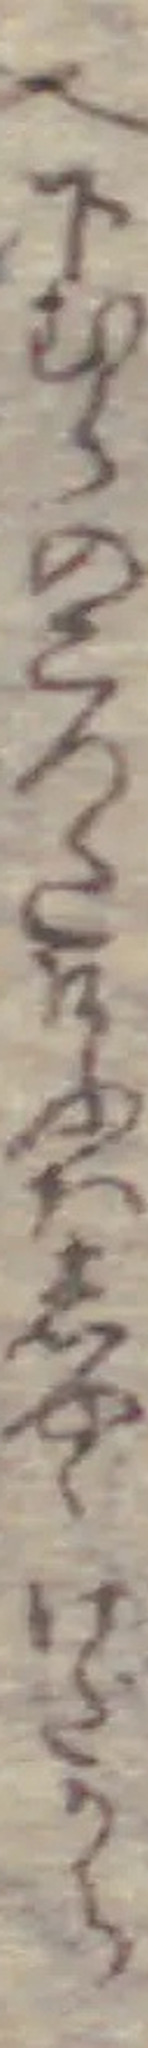下むらのこつたけふはしやくけだから
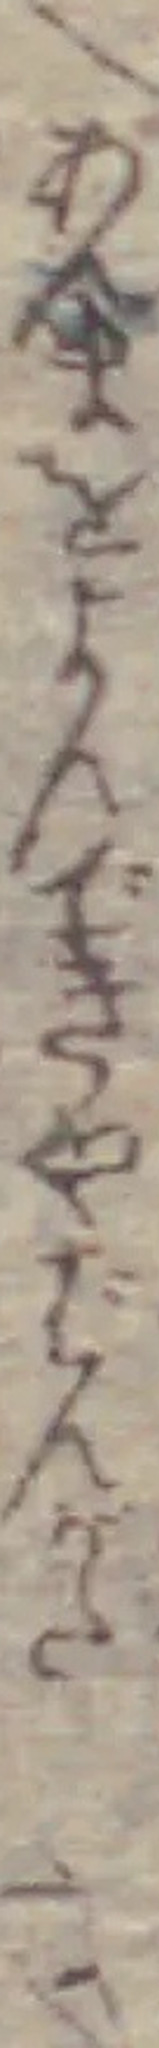あんまをよんできやばんがた
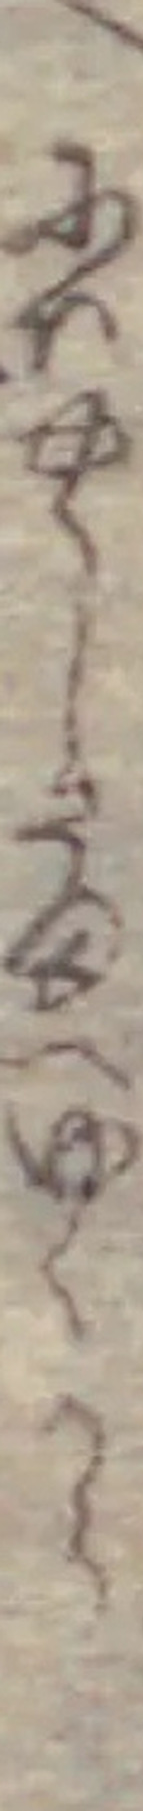にはやくしさまへゆくから

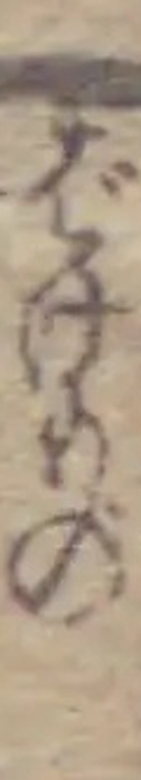ばけもの
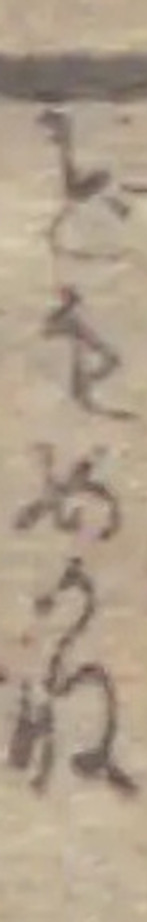どもめかね
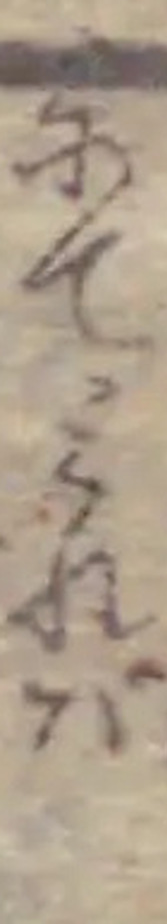にてみれば
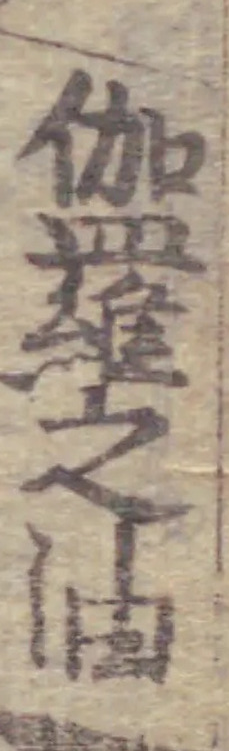伽羅之油
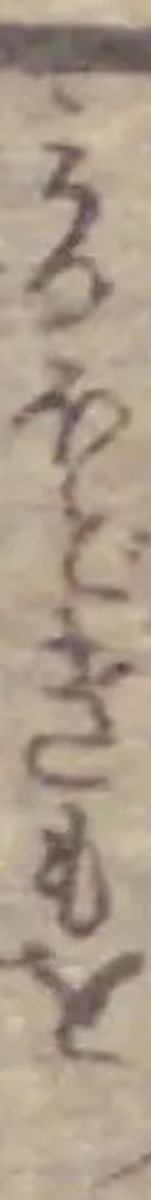みるほどきもを
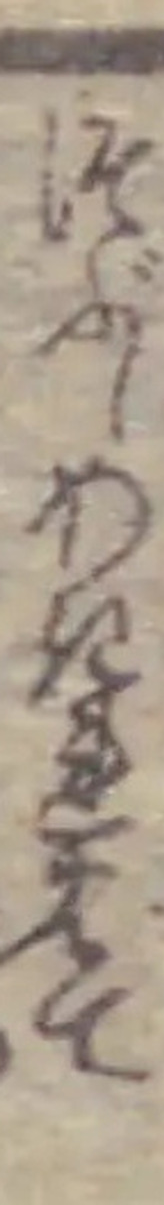つぶしあきれはて
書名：化物大閉口 2巻
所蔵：国立国会図書館 National Diet Library, JAPAN
